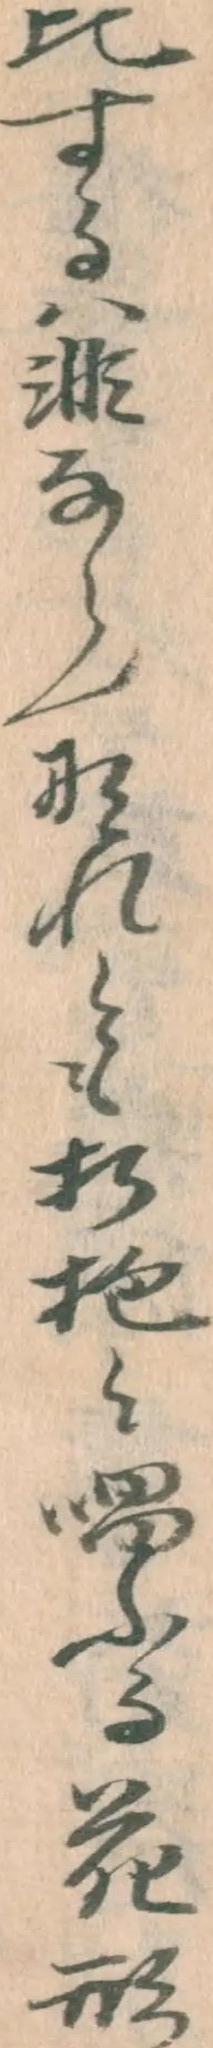比するハ非ならんなれとも折杷と唱ふる花形
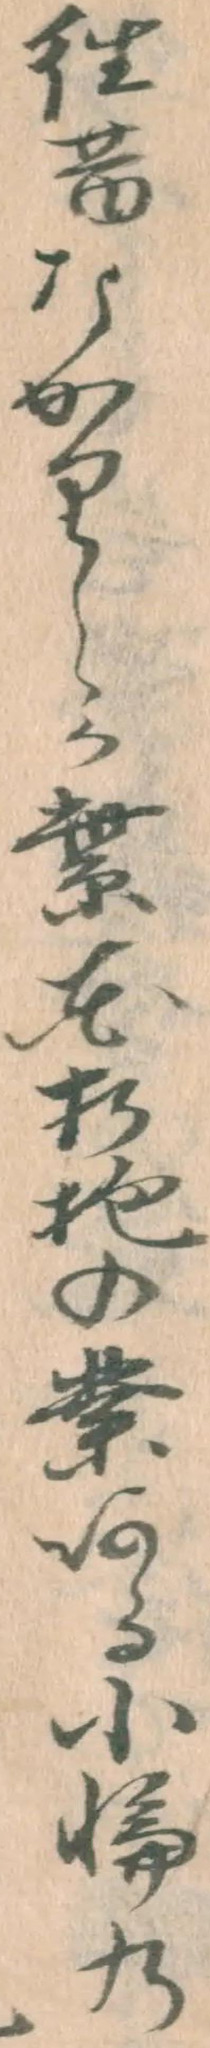往昔なかりしか紫花折杷の業ある小輪の
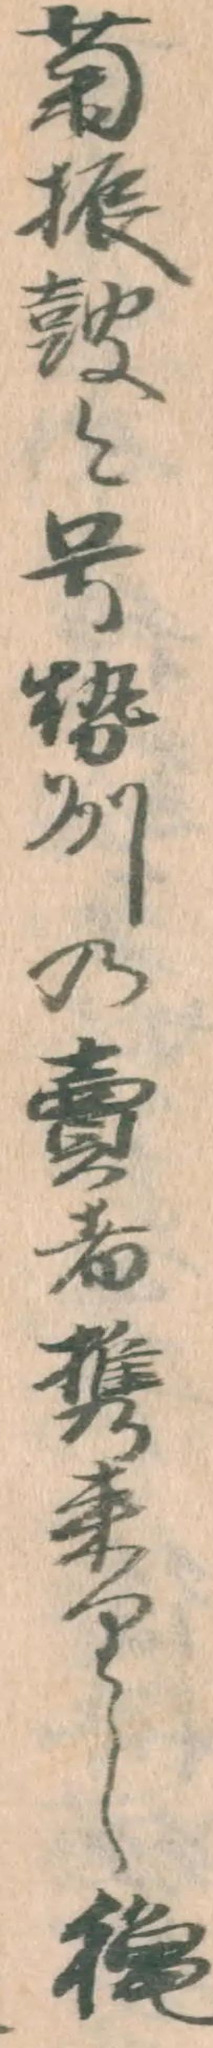菊振鼓と号勢州の売者携来りし秋
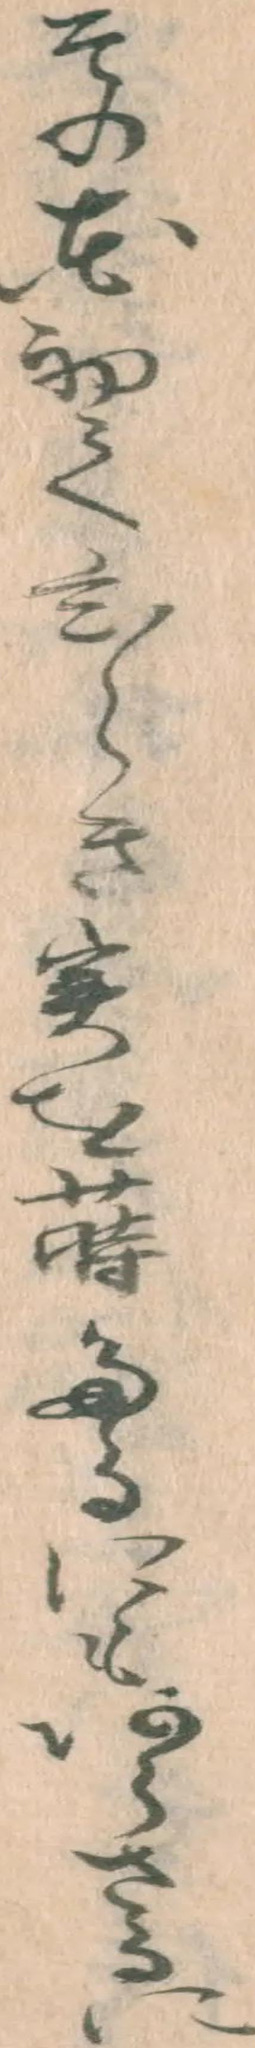その花初てひらき実を蒔たるにもあらさるに
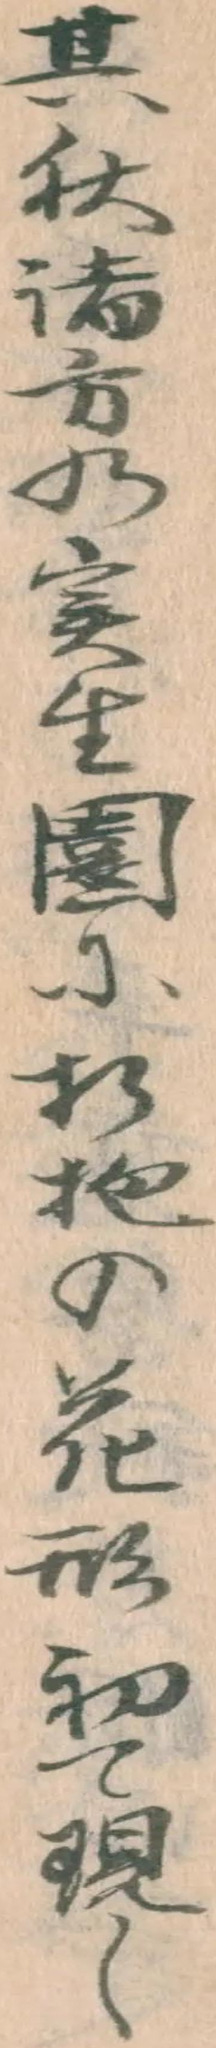其秋諸方の実生園に折杷の花形初て現し
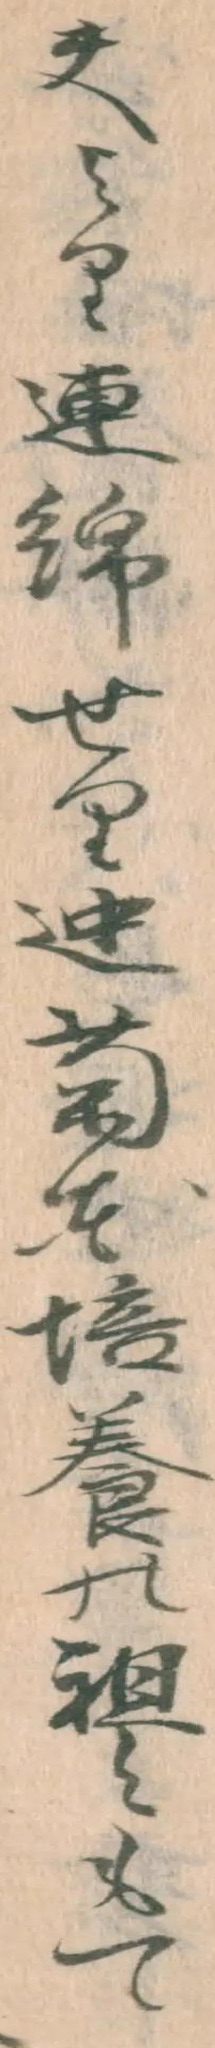夫より連綿せり迚菊花培養の祖ともて
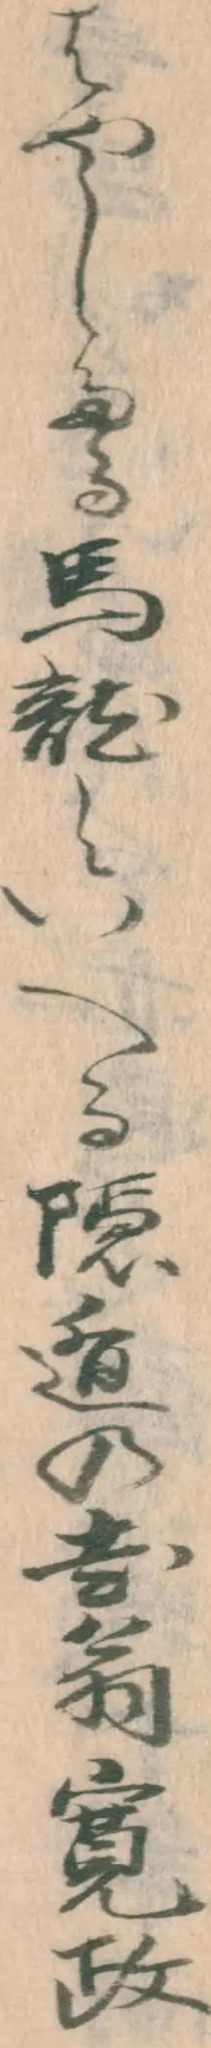はやしたる馬龍といへる隠遁の老翁寛政
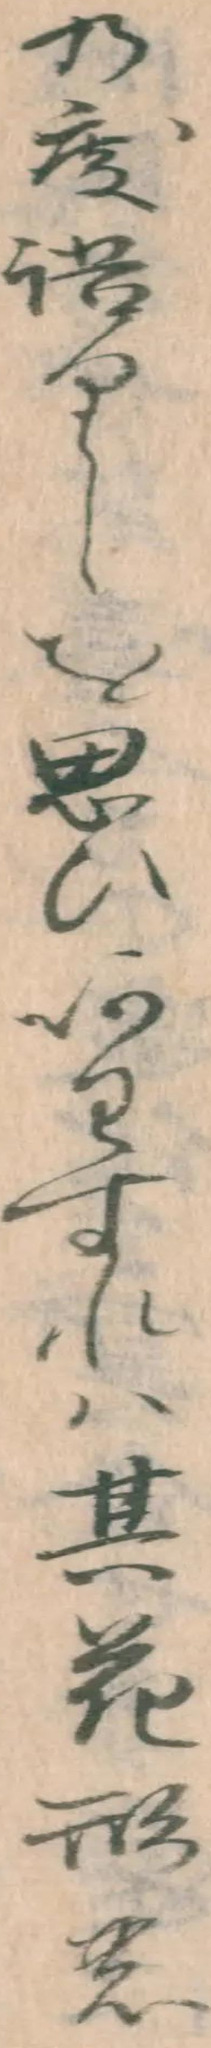の度語りしを思ひあわすれハ其花形の
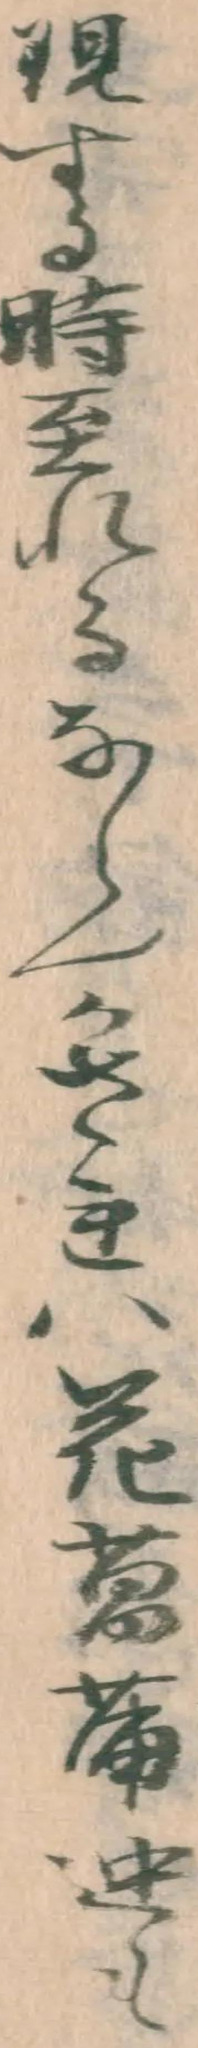現する時至れるならんかされハ花菖蒲迚も
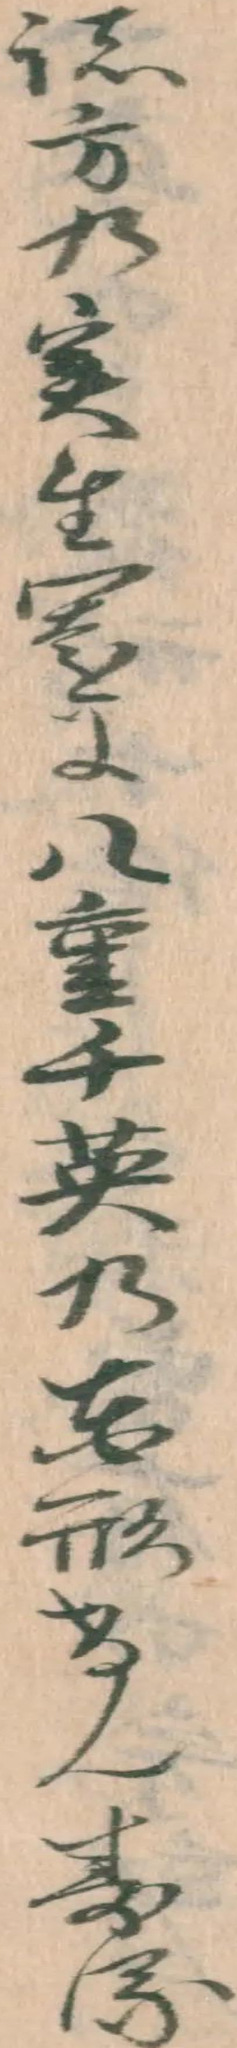諸方の実生還に八重千英の花形けんする
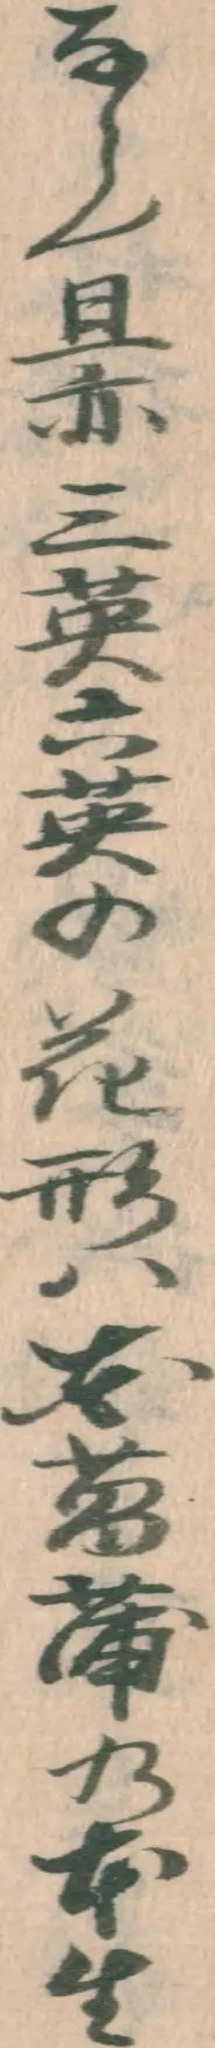ならん且亦三英六英の花形は花菖蒲の本生
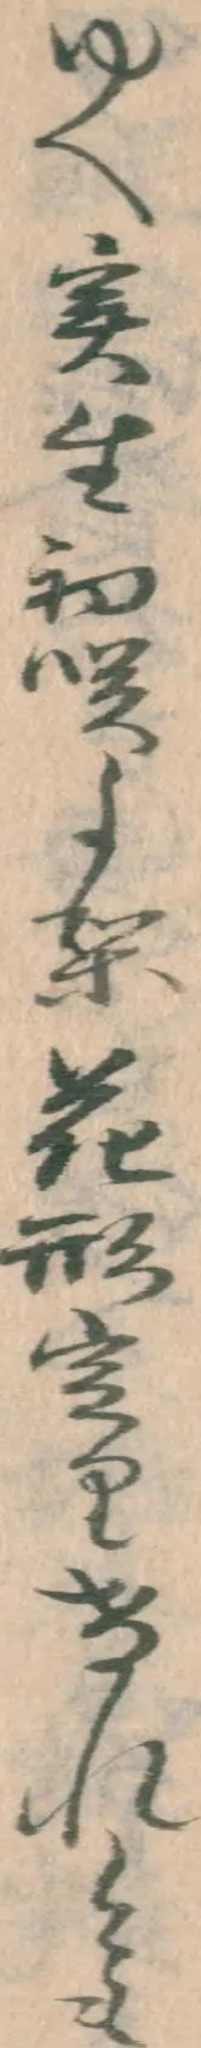ゆへ実生初咲より花形定りけれとも
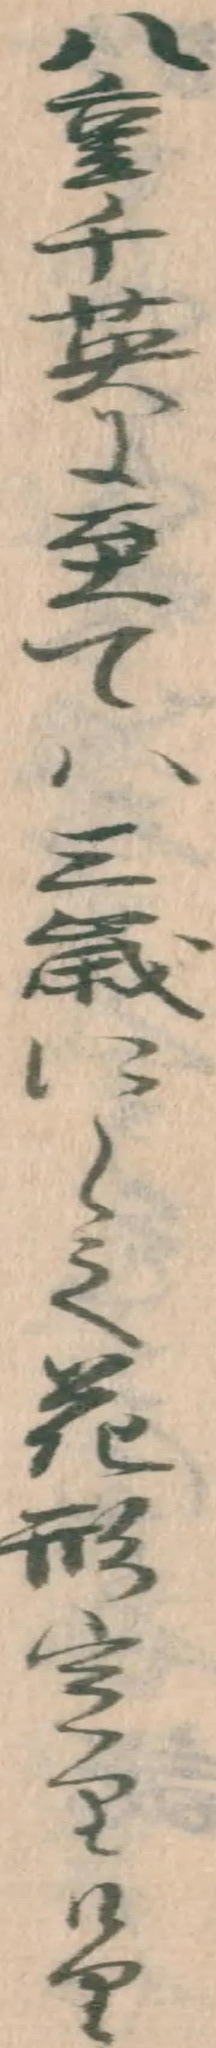八重千英に至ては三歳にして花形定りけり
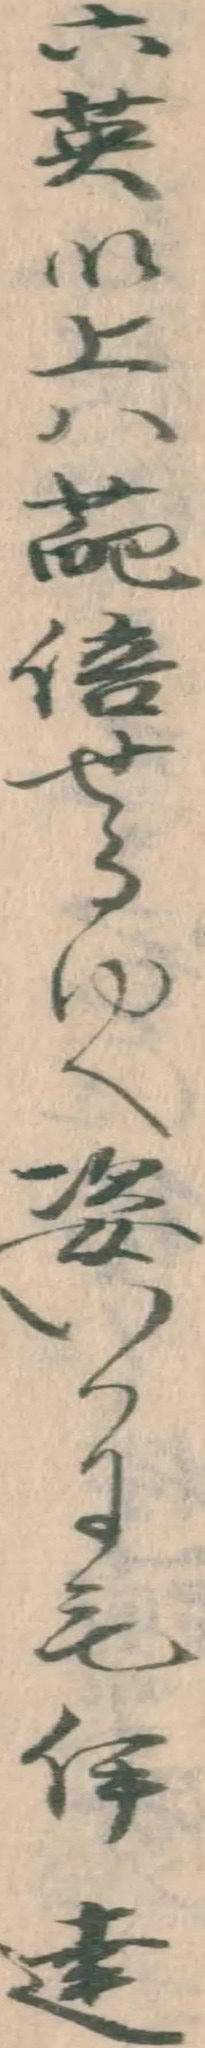六英以上は葩倍せるゆへ姿いかにも伊達
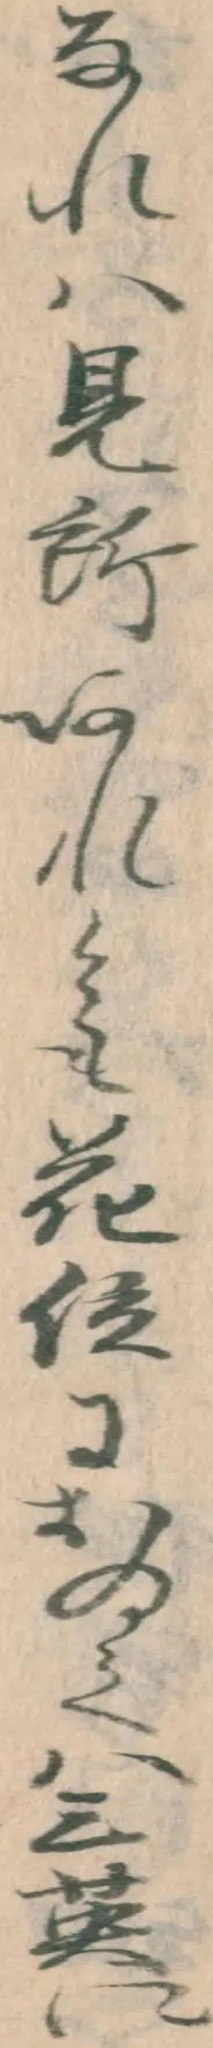なれは見所あれとも花位においては三英に
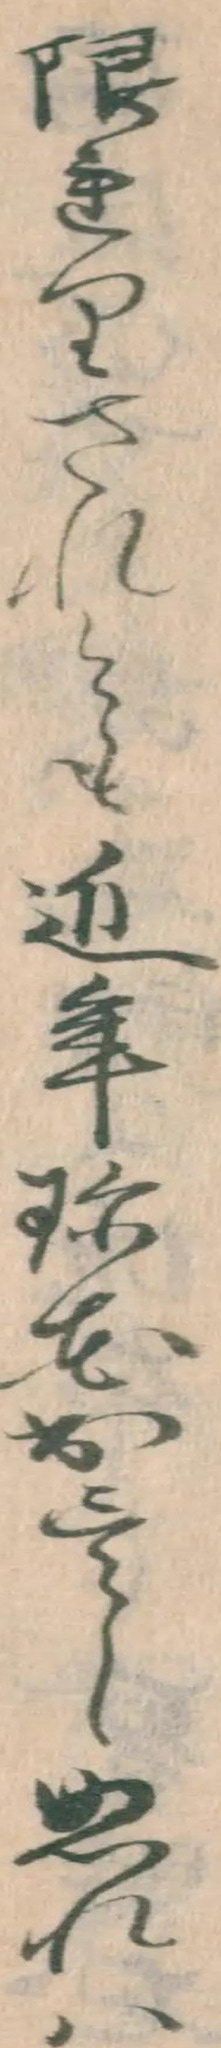限れりされとも近年珍花出しねれは
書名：花菖培養録
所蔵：国立国会図書館 National Diet Library, JAPAN
